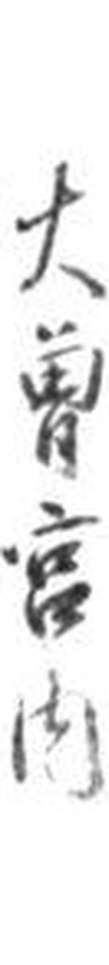大曽宮内
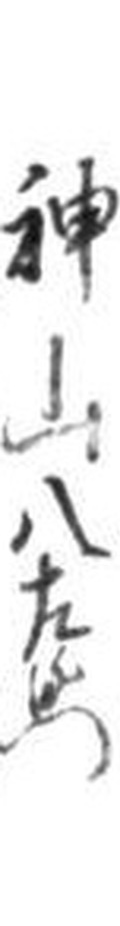神山八左衛門
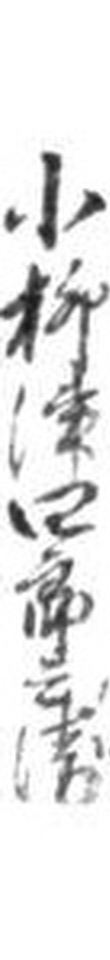小柳津四郎兵衛
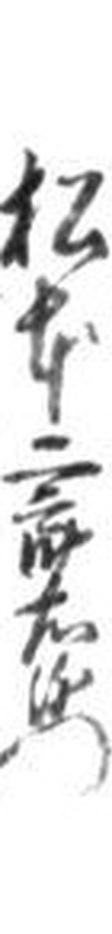松本二郎右衛門
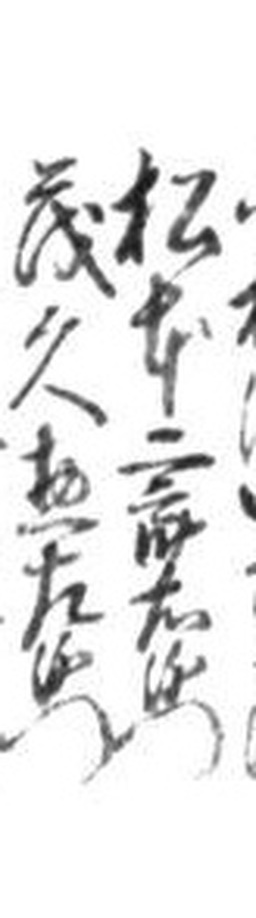茂久惣左衛門
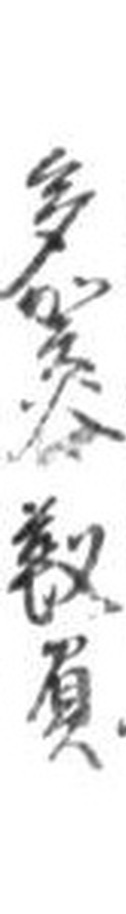多賀谷靱負
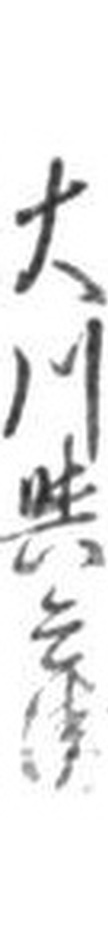大川与兵衛
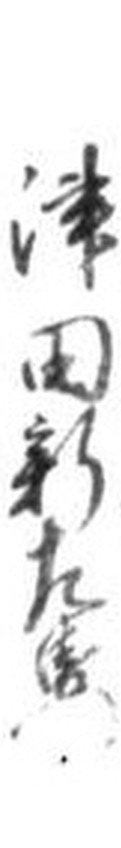津田新左衛門
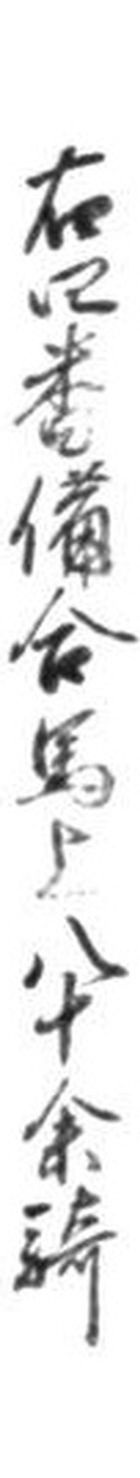右四番備合馬上八十余騎
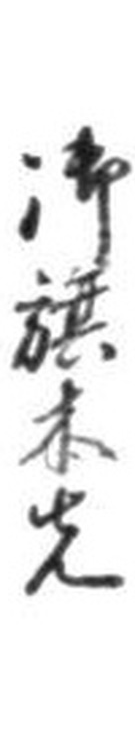御旗本先
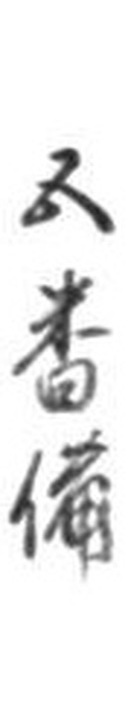五番備
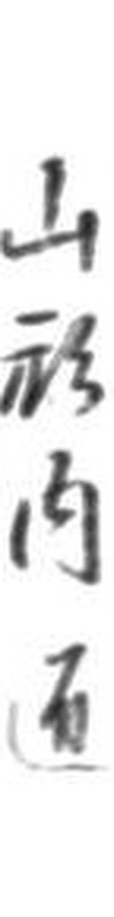山形内匠
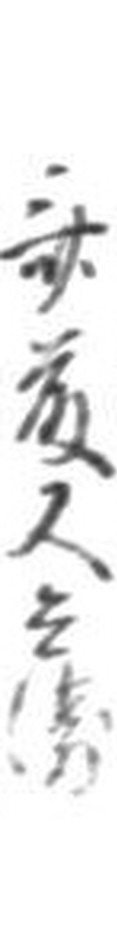斎藤又兵衛
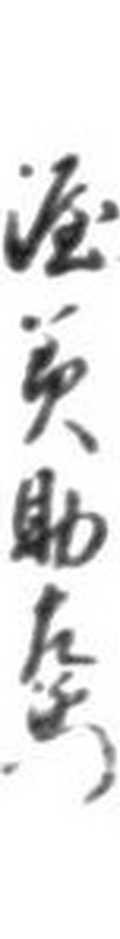渥美助左衛門
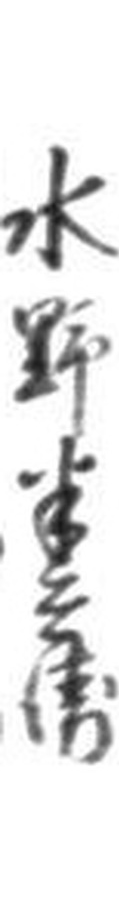水野半兵衛
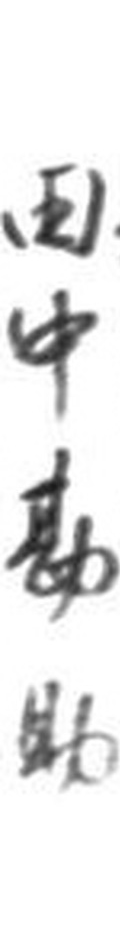田中勘助
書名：家譜 二 忠直公 従文禄四年到慶安四年
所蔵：福井県文書館 Fukui Prefectural Archives
